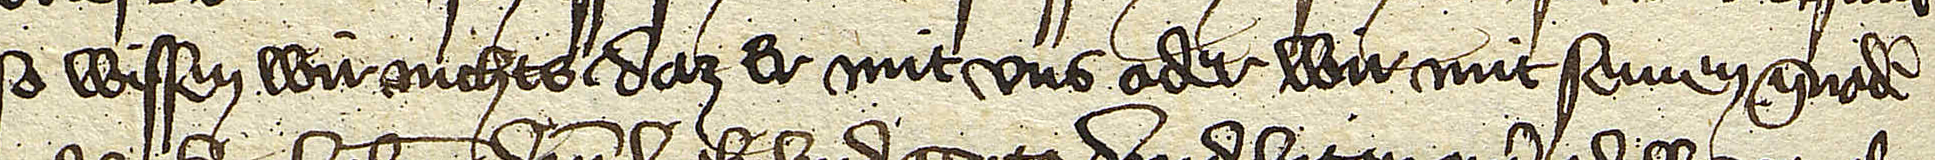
ſo wiſſen wir nichts / daʒ Er mit vns oder wir mit ſeinen gnad*
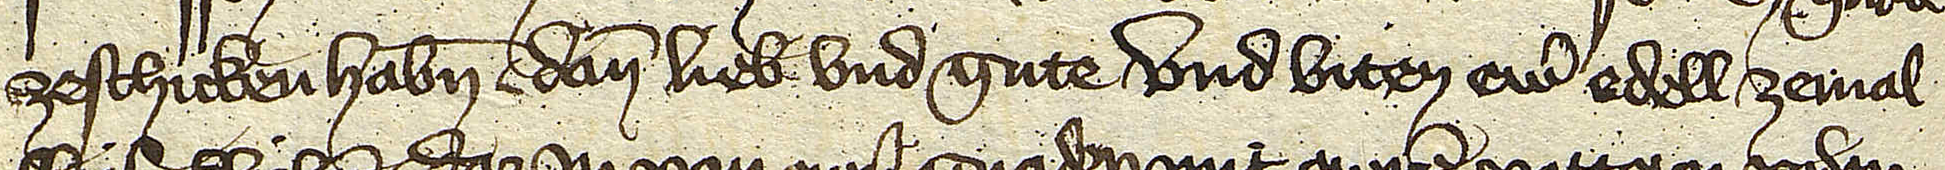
cʒeſchicken habn* / dan* lieb vnd gute / vnd biten ew* edell cʒemal
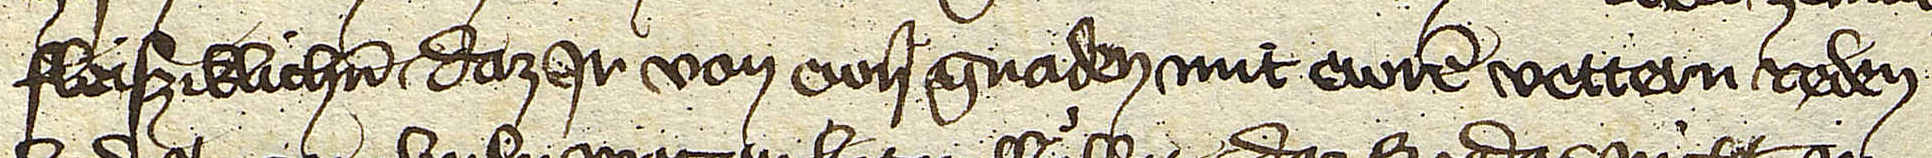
fleiſʒiklichn* / daʒ Ir von ewn* gnaden mit ewre* vettern reden
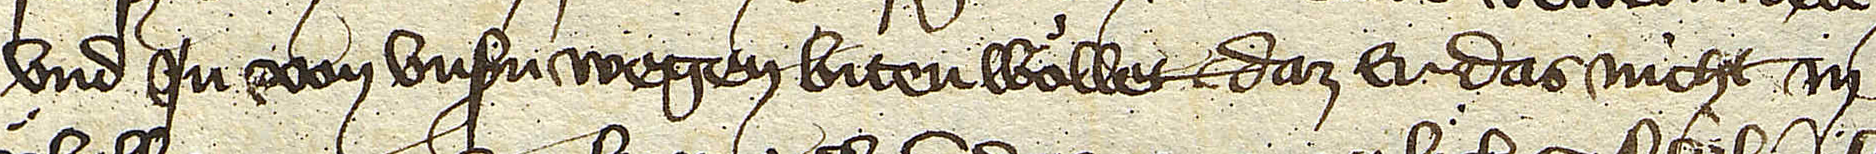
vnd In von vnſ*n wegen biten wöllet / daʒ Er das nicht in
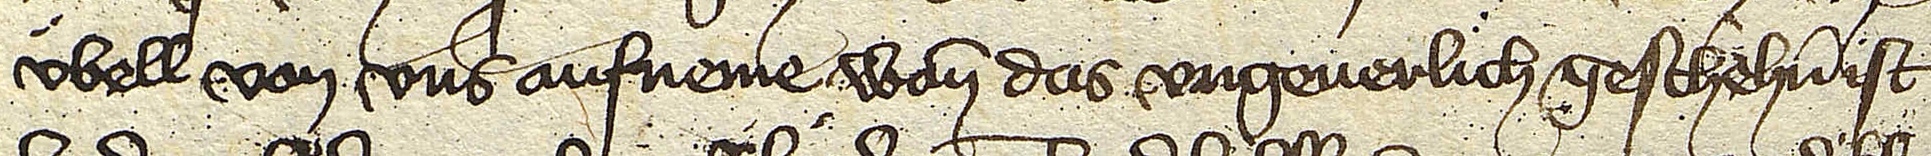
v̈bell von vns aufneme wan* das vngeuerlich geſchehn* iſt
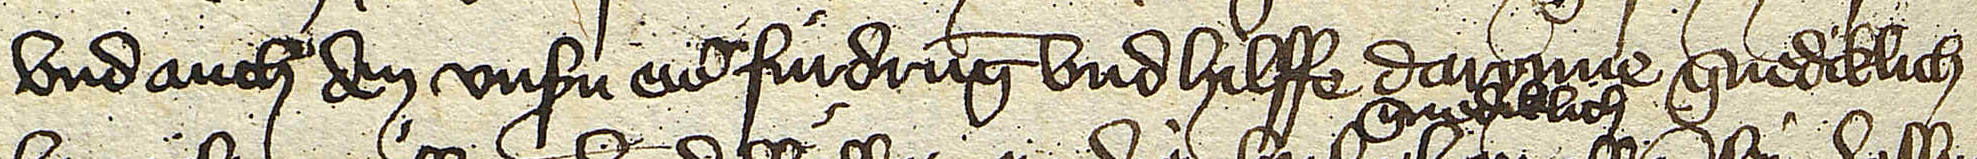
vnd auch den vnſ*n ew* fürdrug* vnd hilffe darynne gnediklich
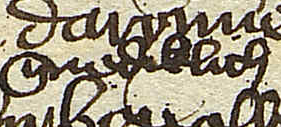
gnediklich
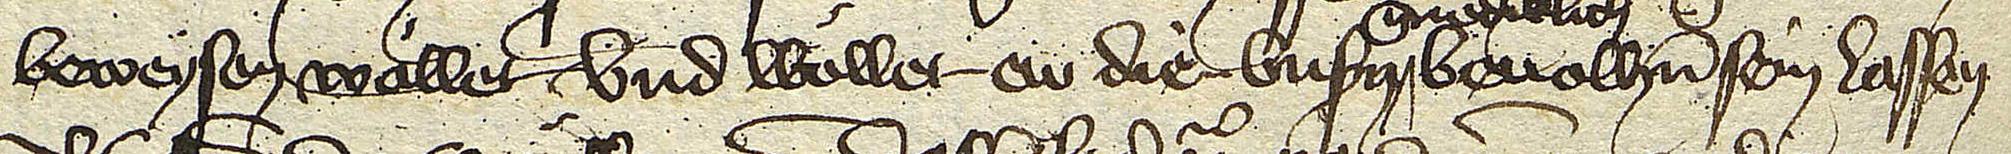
beweyſen wöllet / vnd wöllet ew die vnſ*n beuolhn* ſein laſſen
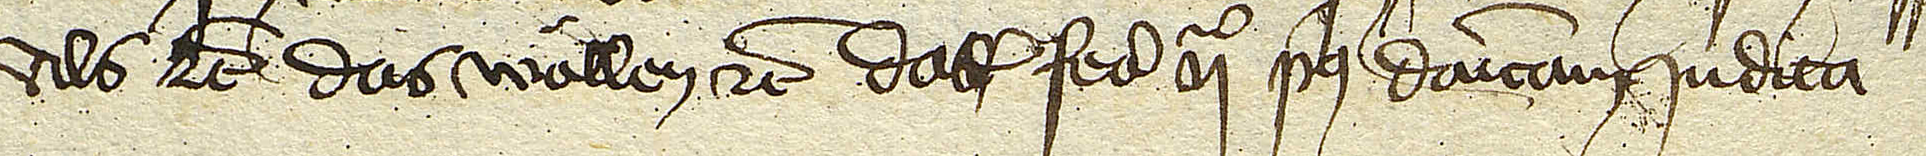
Als ec* das wöllen ec* dat* fea* ii* p* doicam* Iudica
